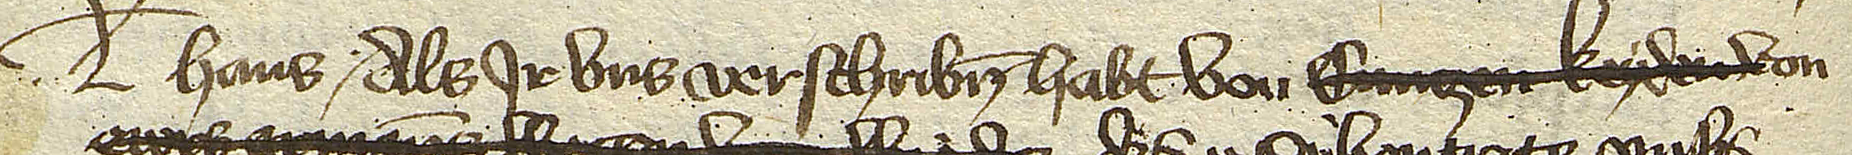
L* hans / Als Ir vns verſchribn* habt von Cuncʒen keyden von
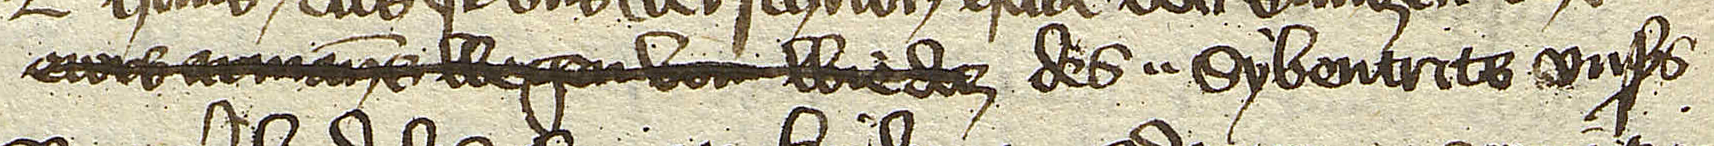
ewrs armans* wegen von wie daʒ des ~ Sybentrits vnſ*s
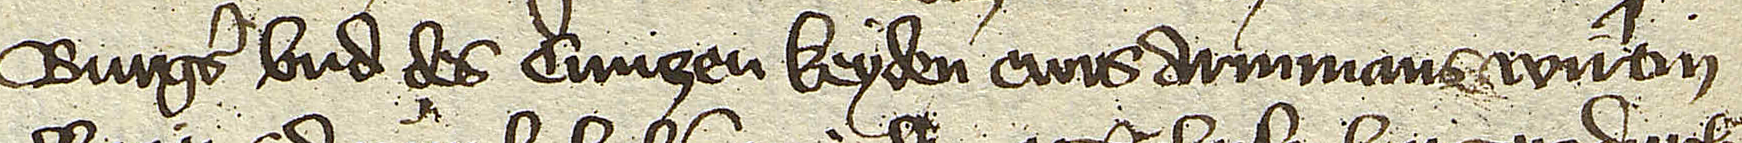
Burgs* vnd des Cuncʒen keyden ewrs Armmans wirtin
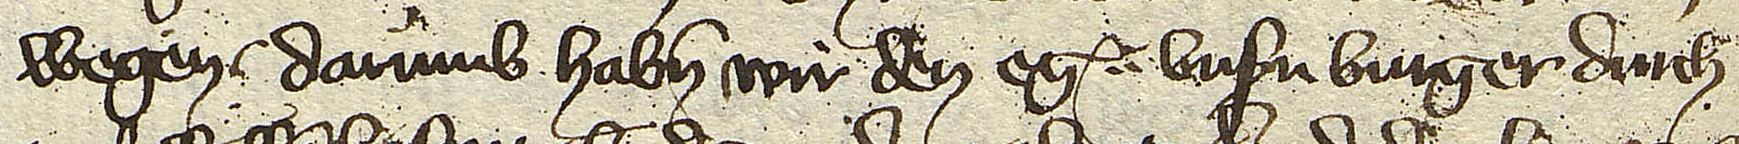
wegen / darümb habn* wir den eg* ~ vnſ*n burger durch
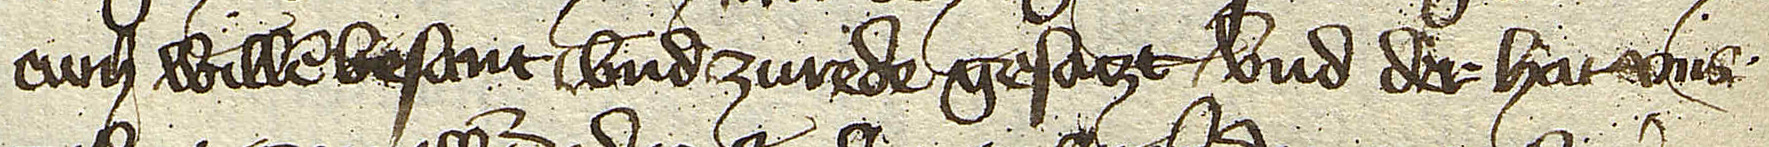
ewn* wille* beſant cʒurede geſacʒt / vnd der hat vns
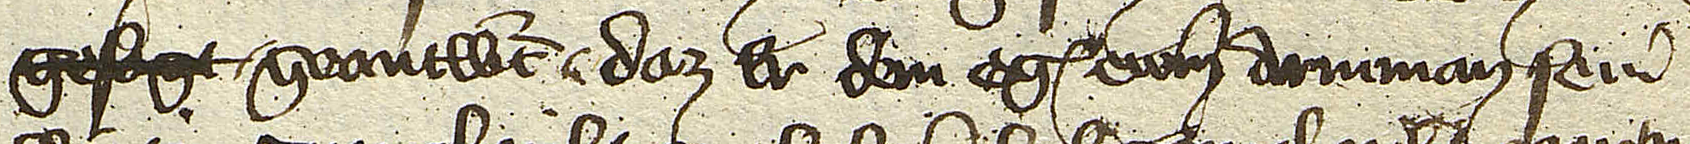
geſagt / geantwt* / daʒ Er dem eg* ewm* Armman ſein*
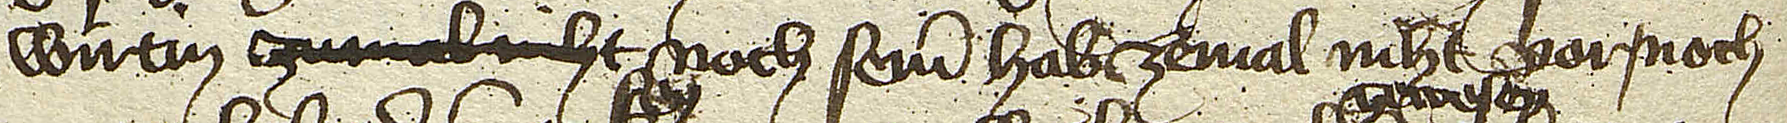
wirtin cʒumal niht noch ſein* hab cʒemal niht vor / noch
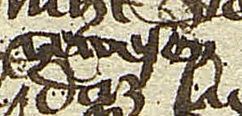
geweſen
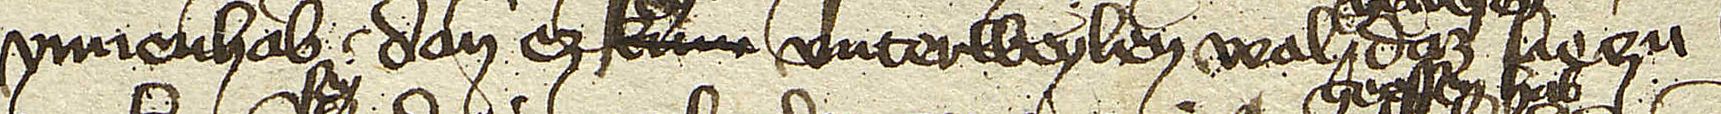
ynnenhab / dan* eʒ kum vnterweylen wol daʒ ſie cʒu
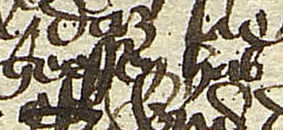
geeſſen hab
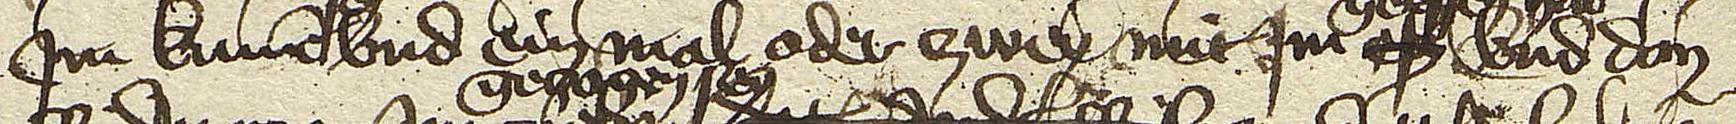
Im kume* vnd ein mal oder cʒwey mit Im eſʒ / vnd dan*
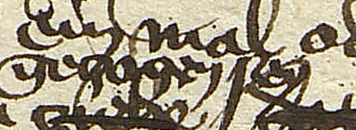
gecʒogen ſey
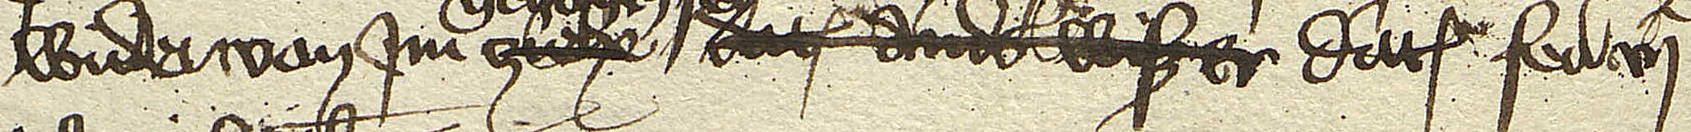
wider von Im cʒiehe / dat* Ands* wiſʒ Er Dat* fea* vi*
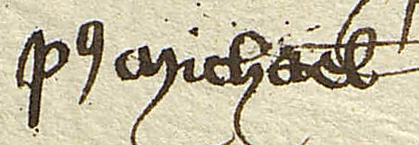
p* Micheal
